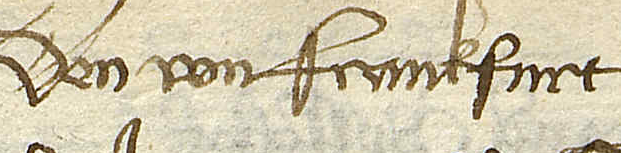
Den von Frankfurt
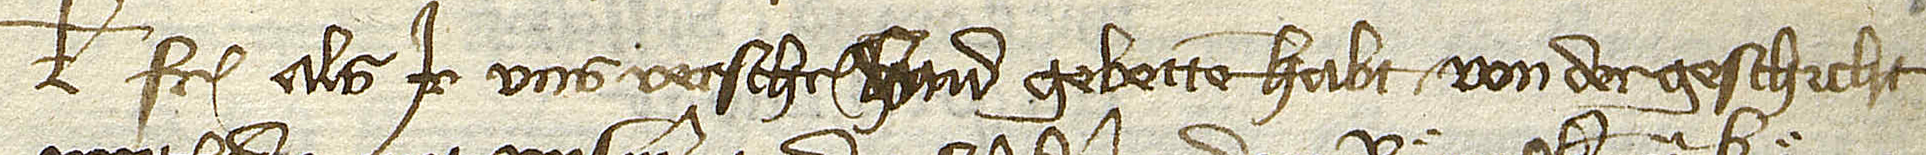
L* fr* als Ir vns verſchr* vnd gebette* habt / von der geſchicht
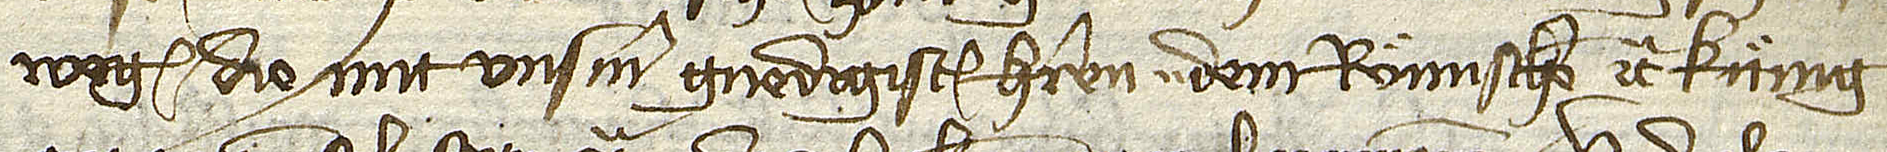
weg* / die mit vnſ*m gnedigiſt* h*ren ~ dem Römiſche* ec* künig
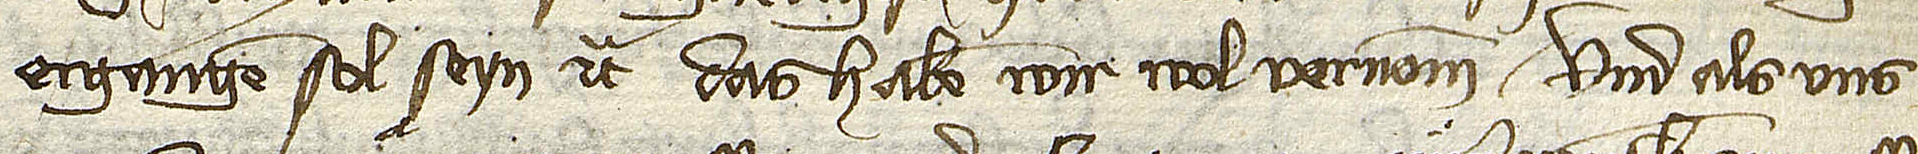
ergange* ſol ſeyn ec* das habe* wir wol vernom* / Vnd als vns
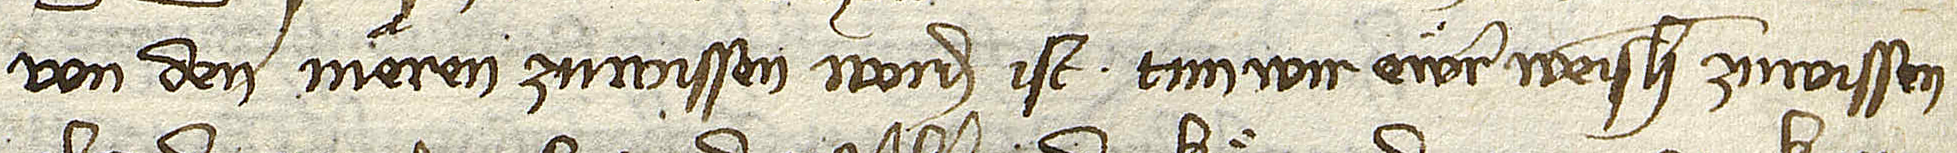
von den mëren ʒuwiſſen word* iſt . tun wir ew*r weiſh* ʒuwiſſen
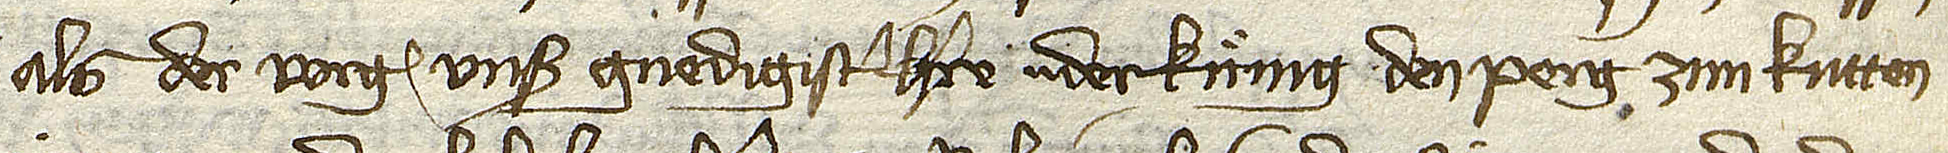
als der vorg* vnſ* gnedigiſt* h*re ~ der künig den perg ʒum kutten
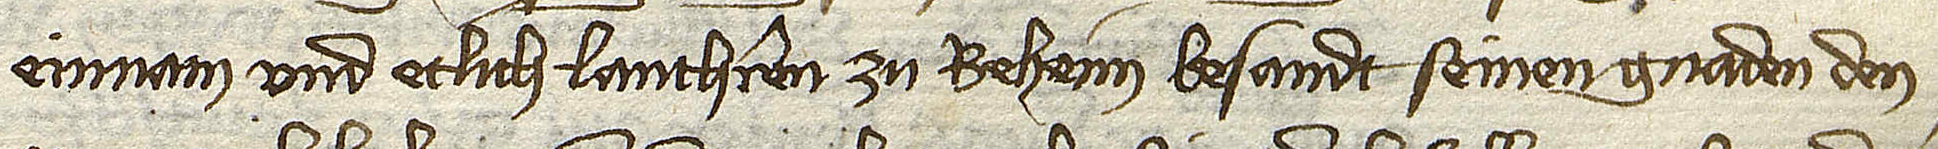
einnam vnd etlich lanth*ren ʒu Beheim beſandt ſeinen gnaden den
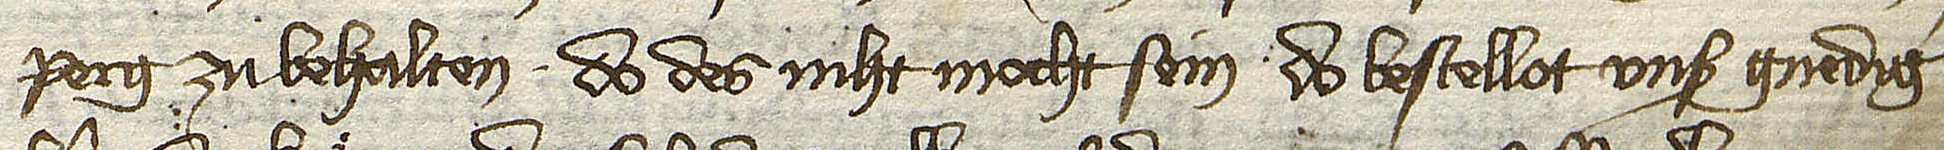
Perg ʒu behalten . do des niht mocht ſein do beſtellot vnſ* gnedig*
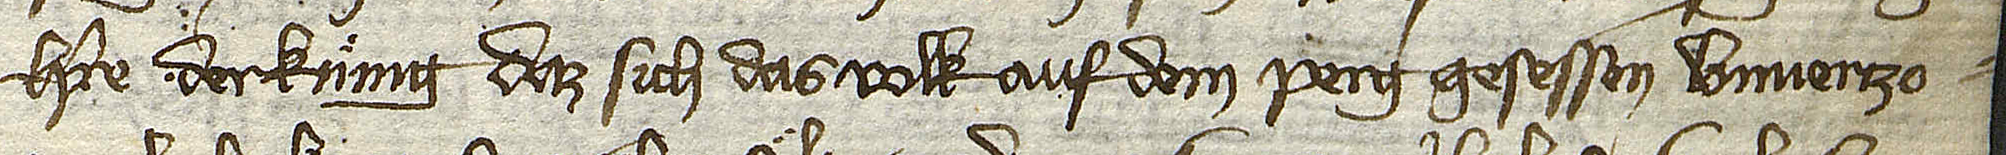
h*re . der künig daʒ ſich das volk auf dem perg geſeſſen Vnuercʒo =
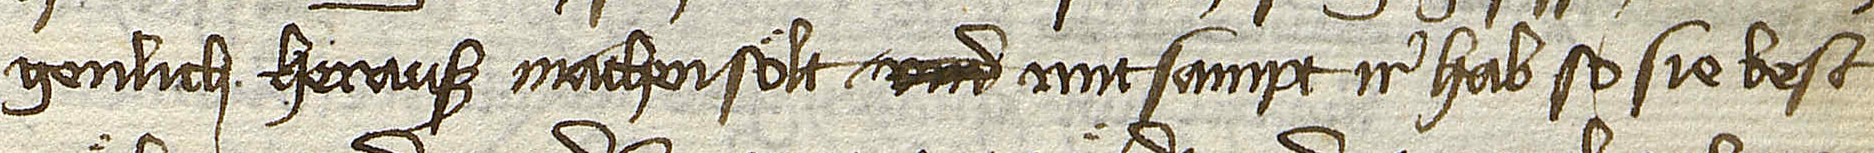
genlich herauſʒ machen ſölt / vnd mit ſampt ir* hab ſo ſie beſt
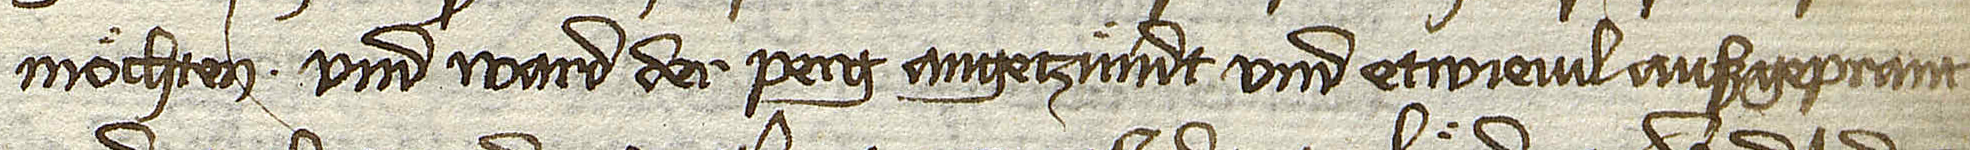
möchten . vnd ward der perg angecʒündt vnd etwieuil auſʒgeprant
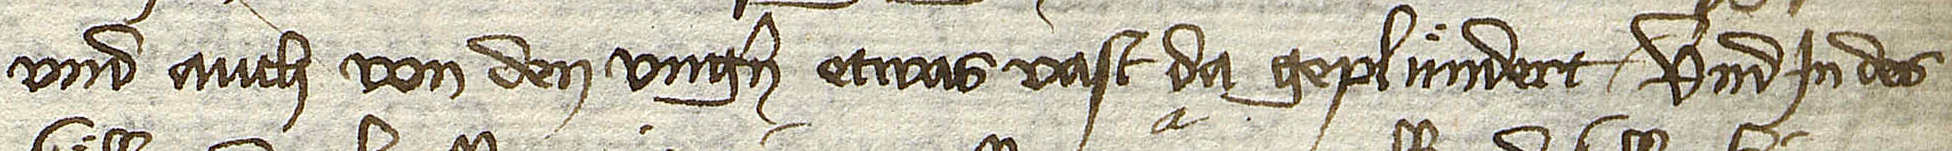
vnd auch von den vng*n etwas vaſt da geplündert / Vnd In des
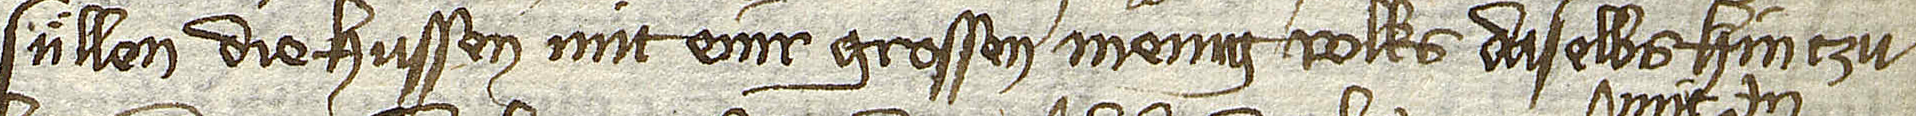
ſüllen die Huſſen mit einr groſſen mënig volks daſelbs hin cʒu
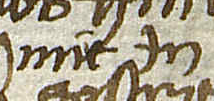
mit In
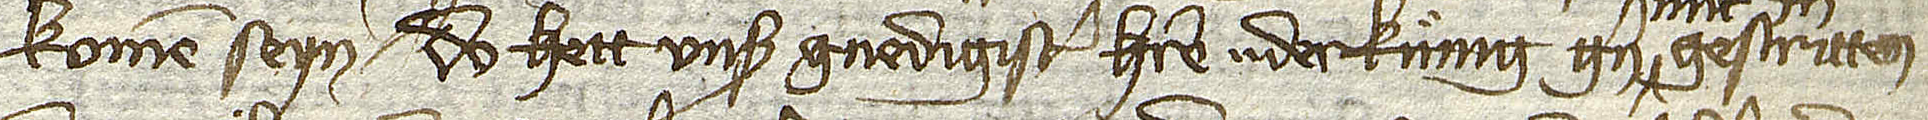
kome* ſeyn / Do hett vnſ* gnedigiſt* h*re ~ der künig g*n geſtritten
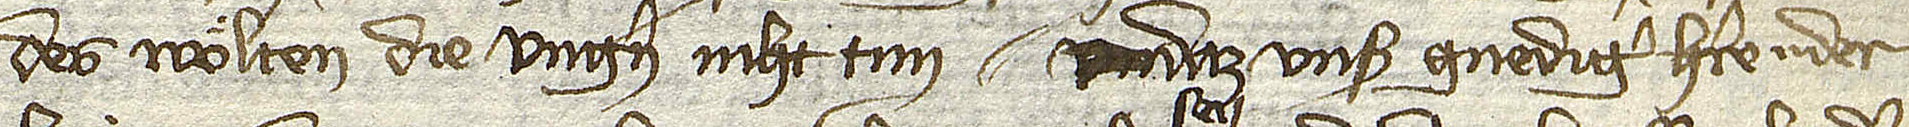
des wölten die vng*n niht tun / vn daʒ vnſ* gnedig* h*re ~ der
